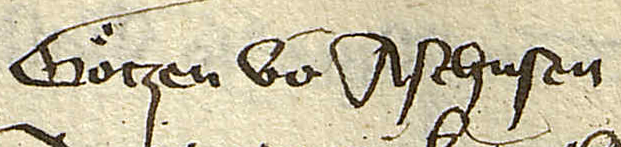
Göcʒen vo* Aſchuſen
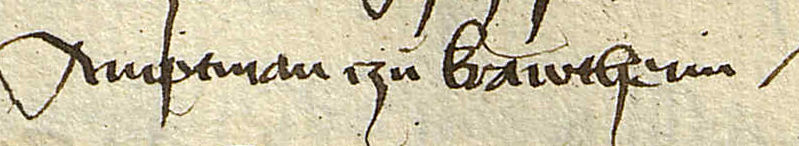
Amptman cʒu krawtheim /
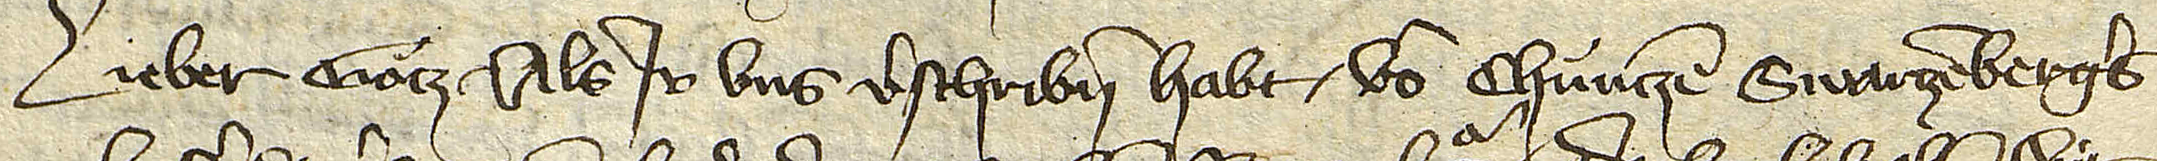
Lieber Göcʒ / Als Ir vns v*ſchribn* habt / vo* Chüncʒe* Swarcʒe*berg*s
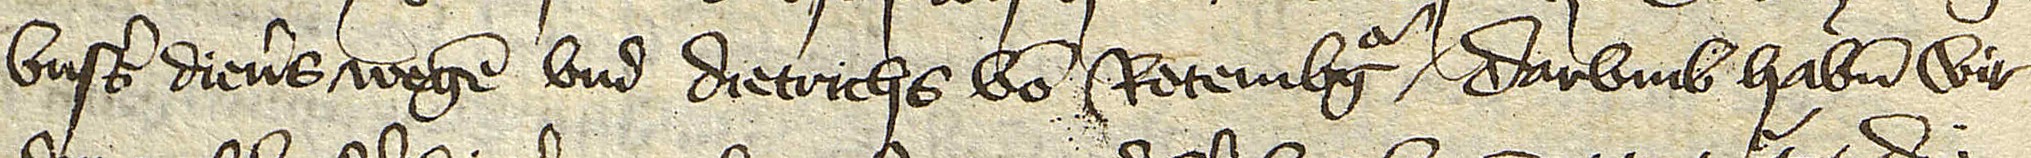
vnſs* dien*s wege* vnd dietrichs vo* Rotemb*g / Darvmb habn* wir
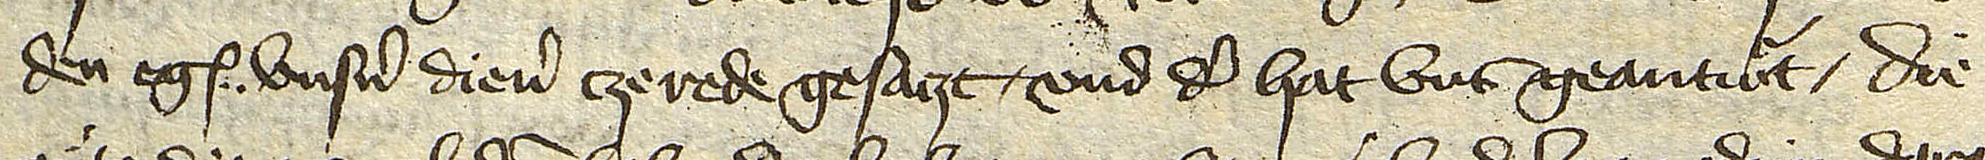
den eg* ~ vnſn* dien* cʒe rede gesacʒt / vnd d* hat vns geantw*t / die
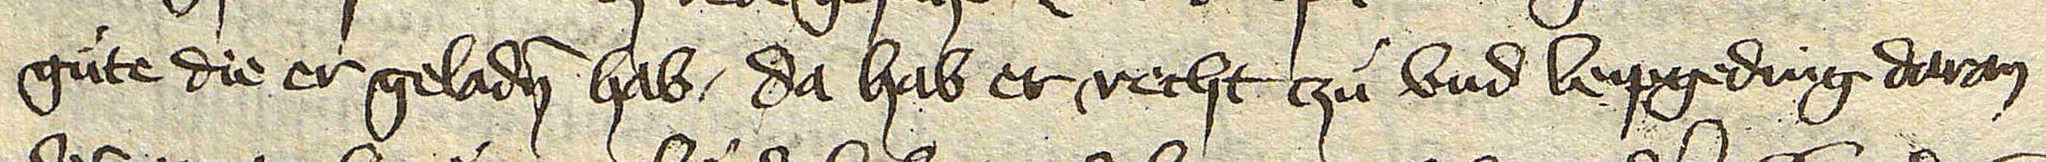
güte die er geladn* hab / da hab er recht cʒü vnd leipgeding daran
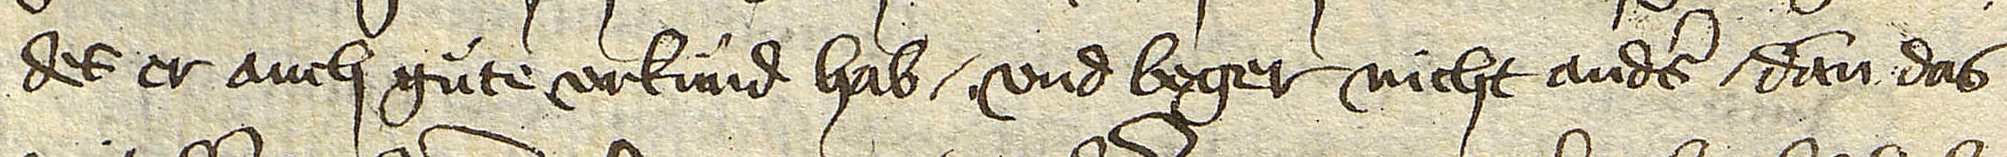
des er auch güte vrkünd hab / . vnd beger nicht ands* / dan* das
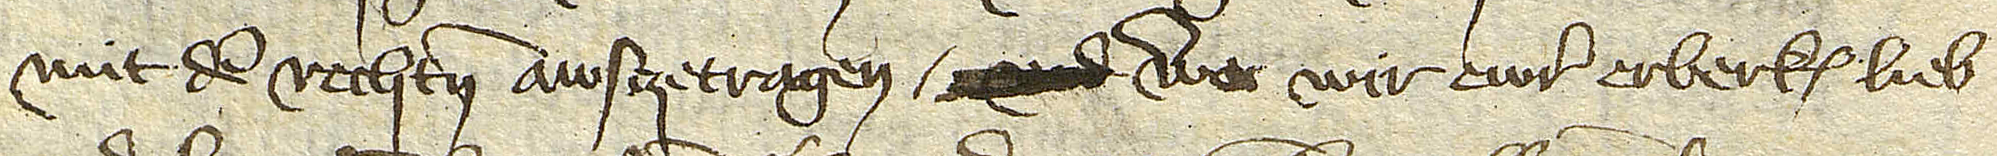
mit d* rechtn* auſcʒetragen / vnd Wo wir ewr* erberk* lieb
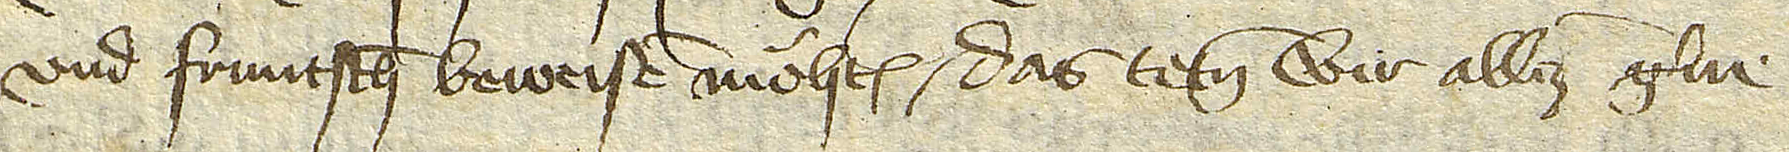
vnd fruntſch* beweiſe* möht* / das tetn* wir allcʒ* g*ne
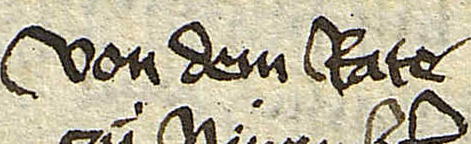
von dem Rate
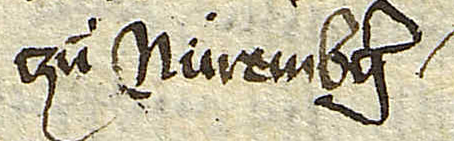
cʒü Nürembg* /
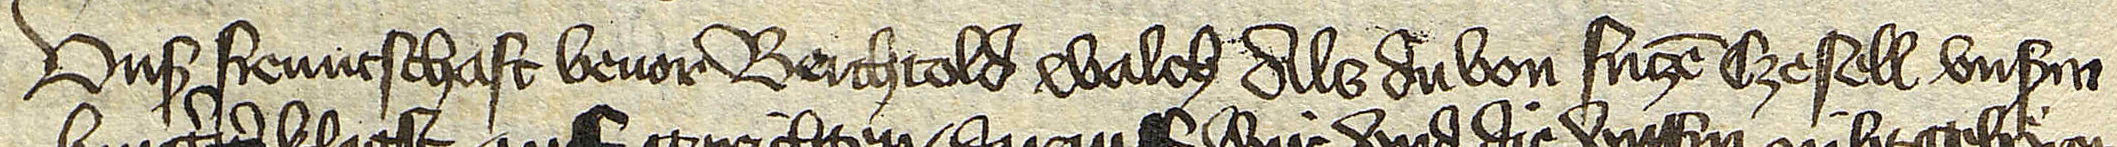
Vnſ* freuntſchaft beuor Berchtold Walch Als du von fricʒe* Cʒeſell vnſ*rn
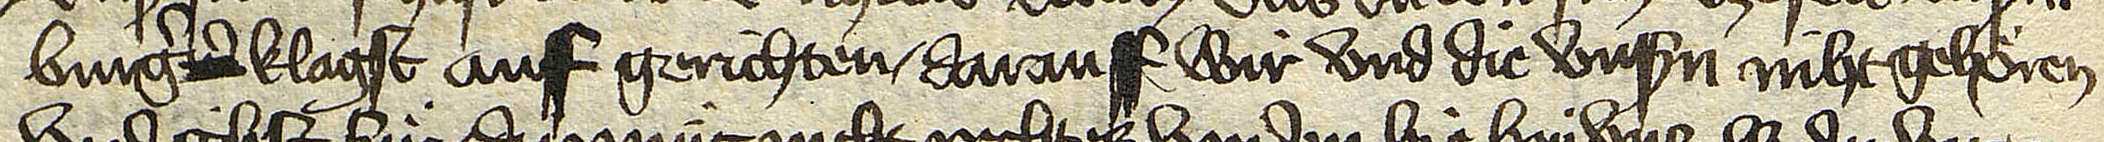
burgn* klagſt auf gerichten / darauff wir vnd die vnſ*n niht gehören
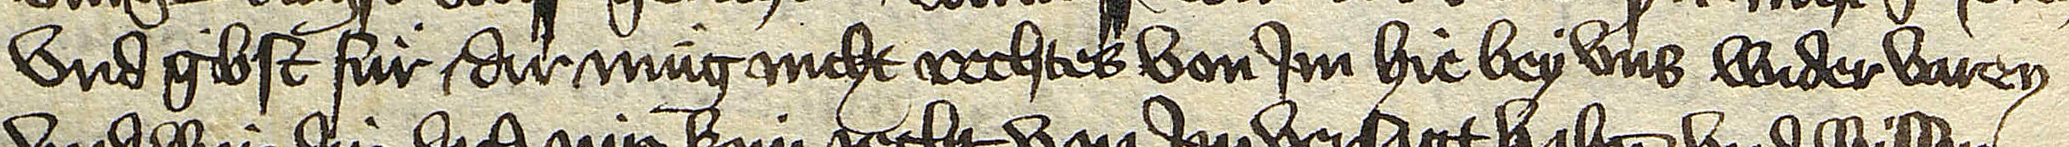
vnd gibſt für / dir müg nicht rechtes von Im hie bey vns wider varen
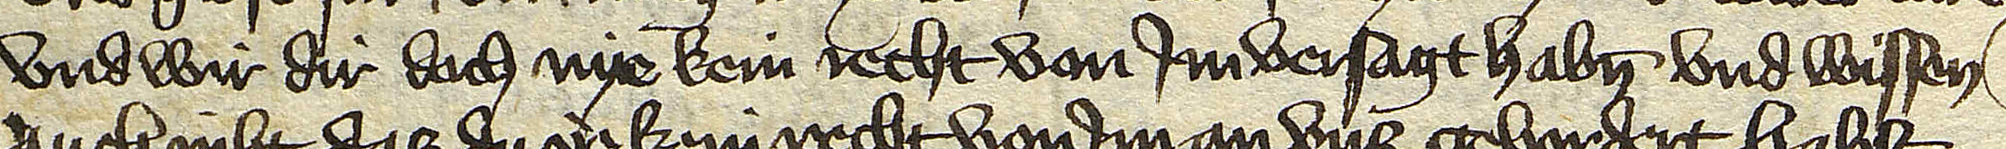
vnd wie dir doch nye kein recht von Im verſagt habn* vnd wiſſen
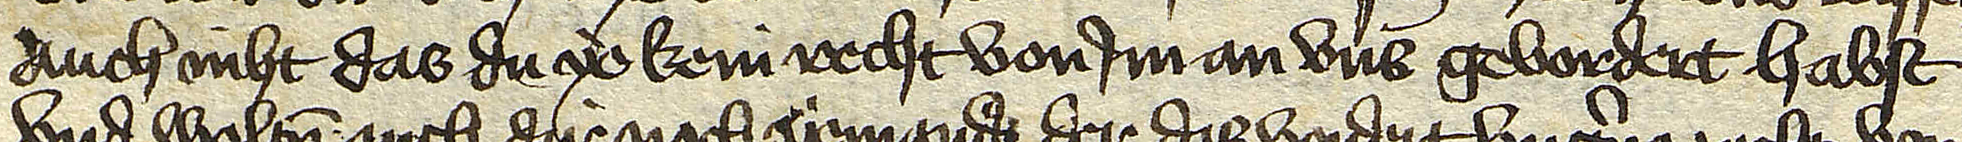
Auch niht das du ye kein recht von Im an vns gevordert habſt
